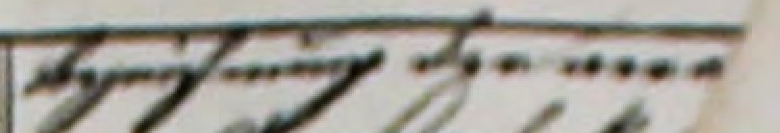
Bezeichnung der erarischen
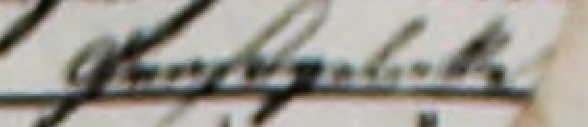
Graßgelake
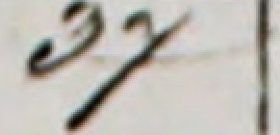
37
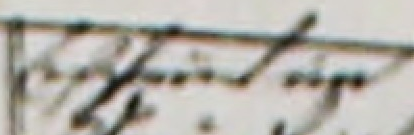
Esseint im
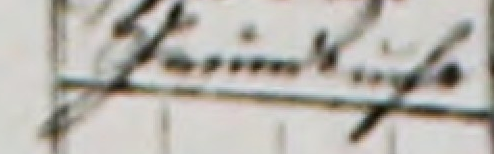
Grundbuche
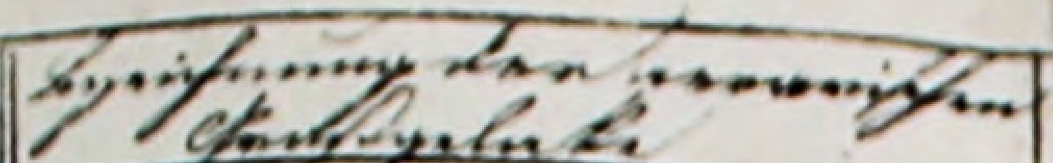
Bezeichnung der erarischen
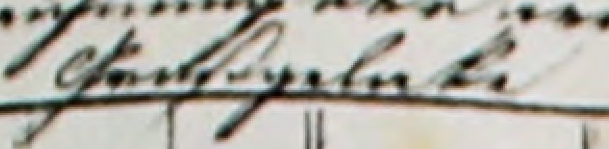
Graßgelake
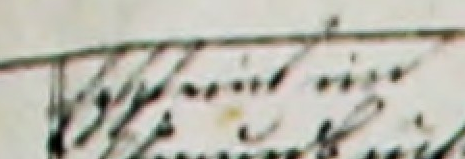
Esseint im
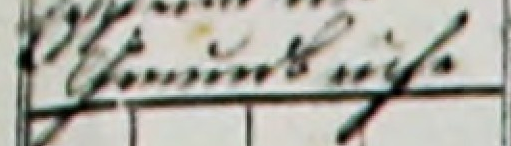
Grundbuche
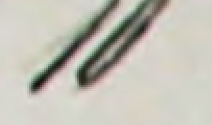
10
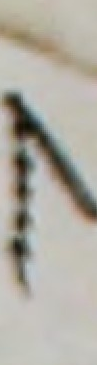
ung
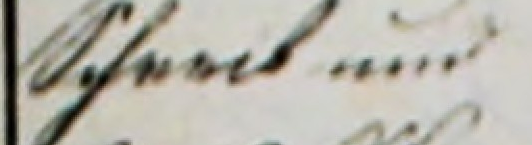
Schreib und
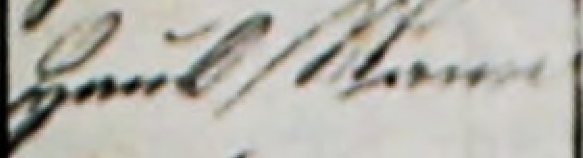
Haus Name
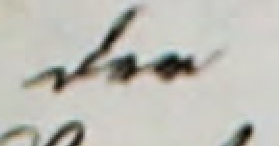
der
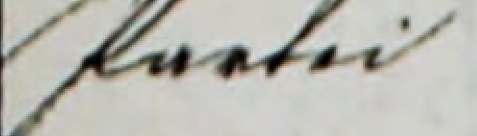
Partei.
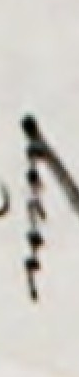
ung
